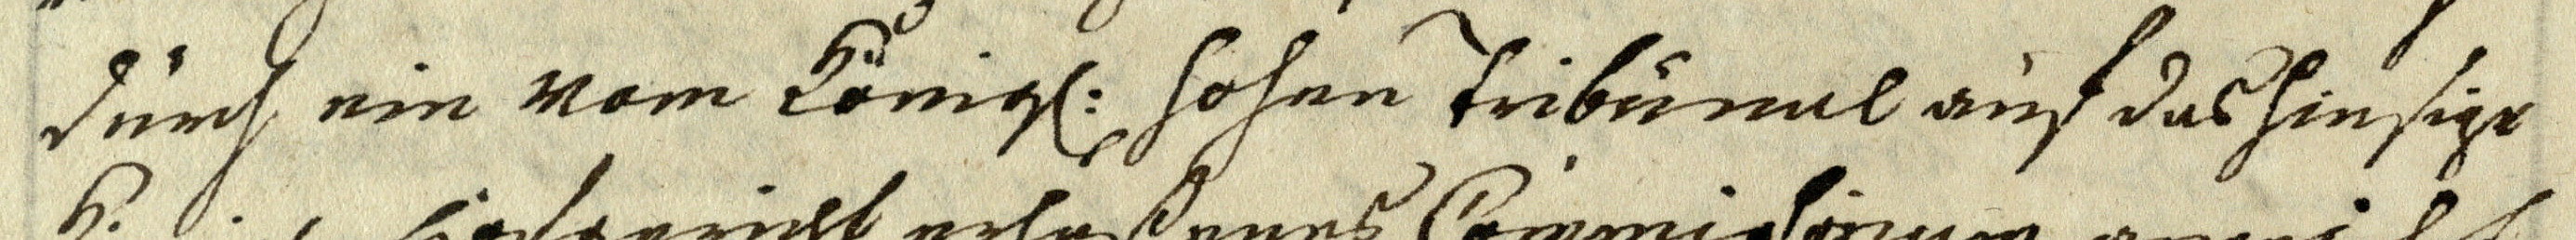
durch ein vom Königl. hohen Tribunal auf das hiesige
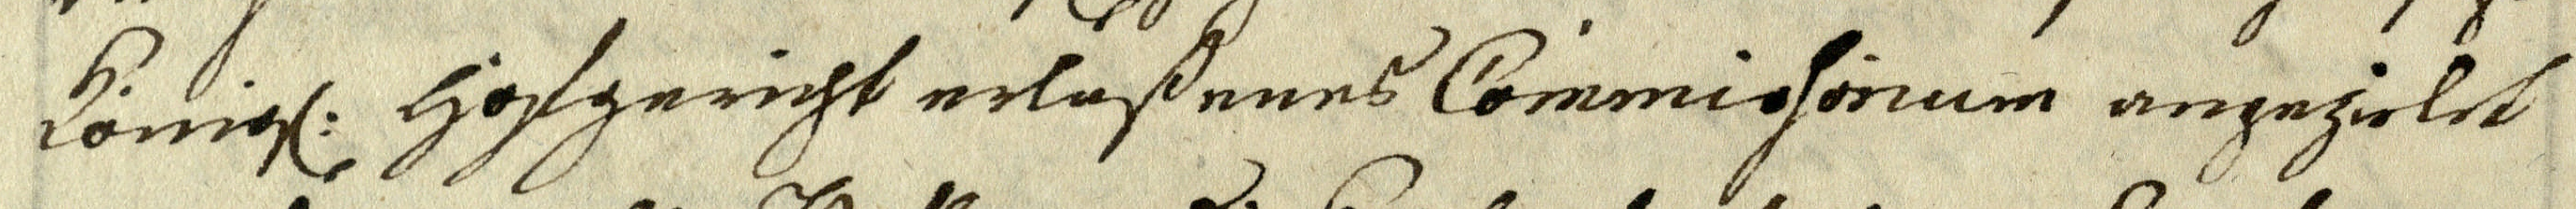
Königl. Hofgericht erlaßenes Commissorium angezielet
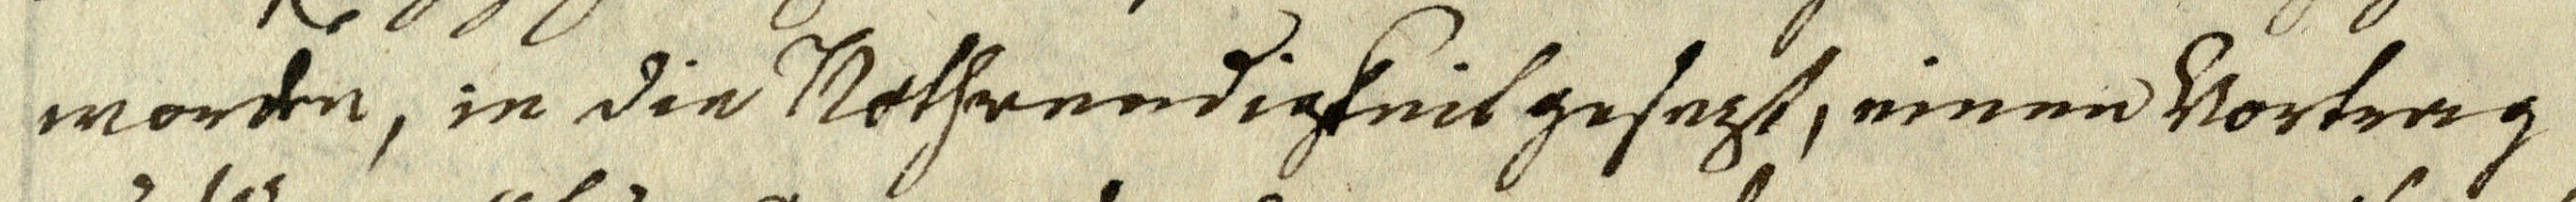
worden, in die Nothwendigkeit gesezt, einen Vortrag
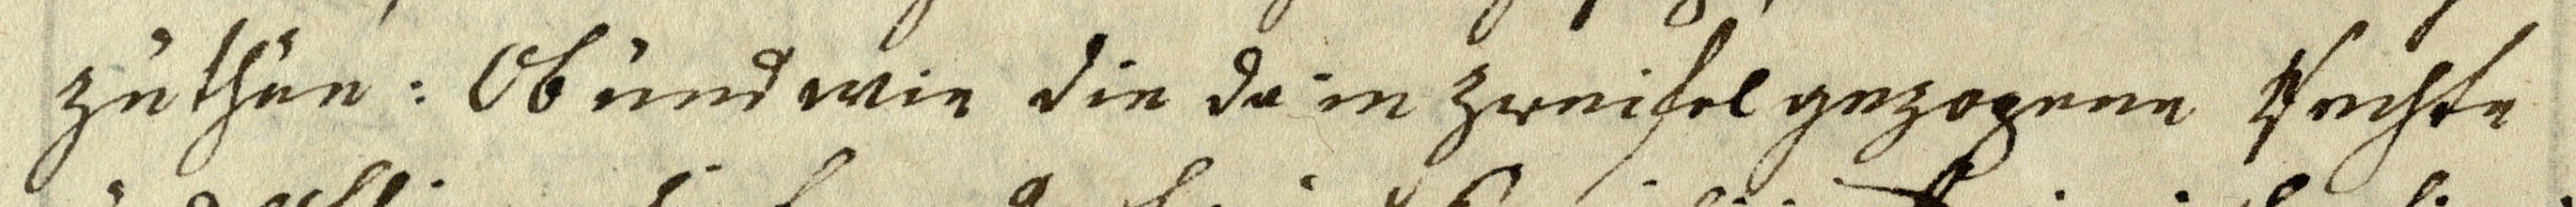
zuthun: Ob und wie die in Zweifel gezogene Rechte
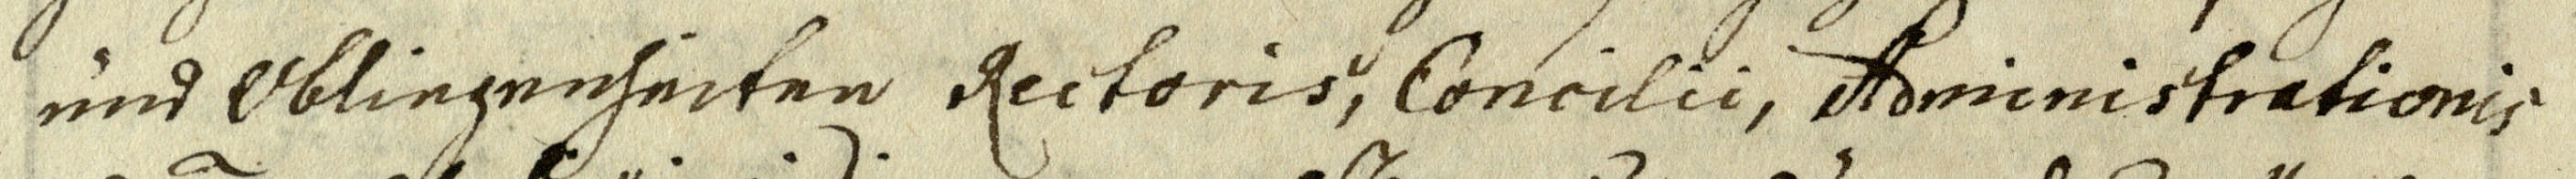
und Obliegenheiten Rectoris, Concilii, Administrationis
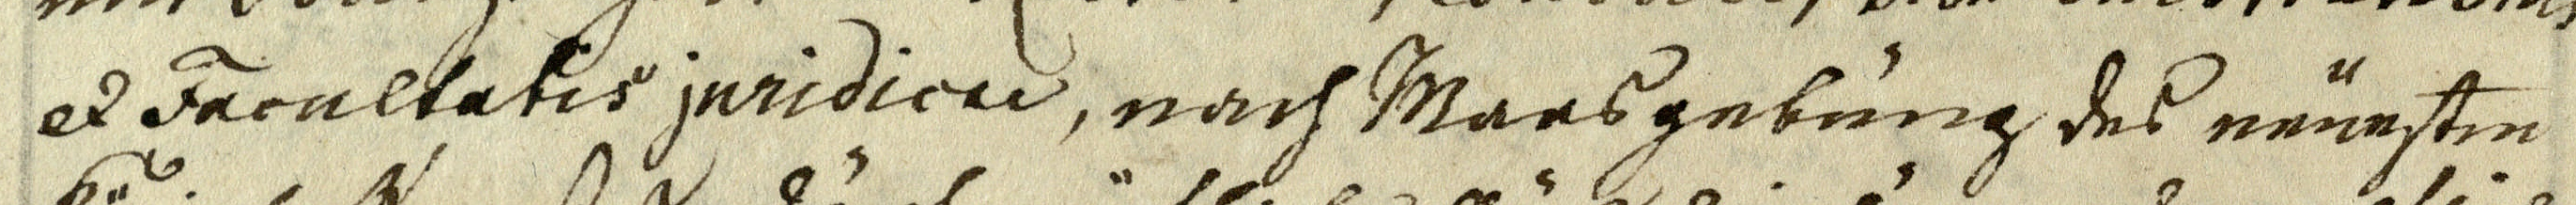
et Facultatis juridicae, nach Maasgebung des neuesten
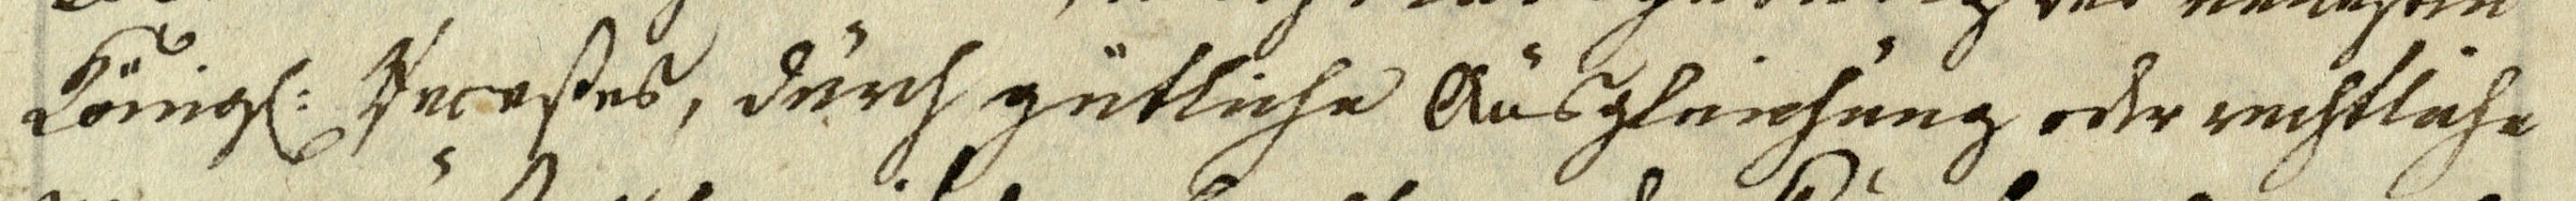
Königl. Receßes, durch gütliche Ausgleichung oder rechtliche
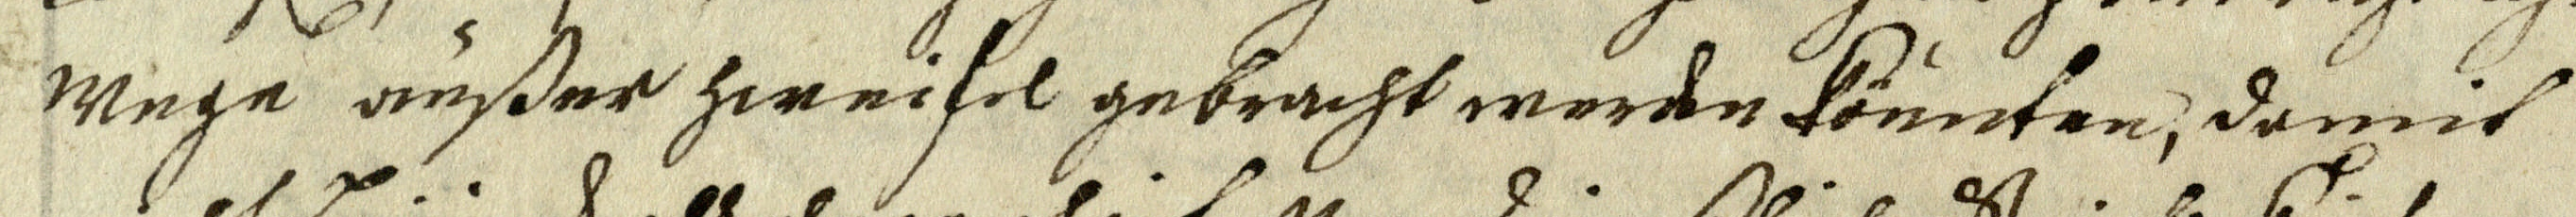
Wege außer Zweifel gebracht werden könnten, damit
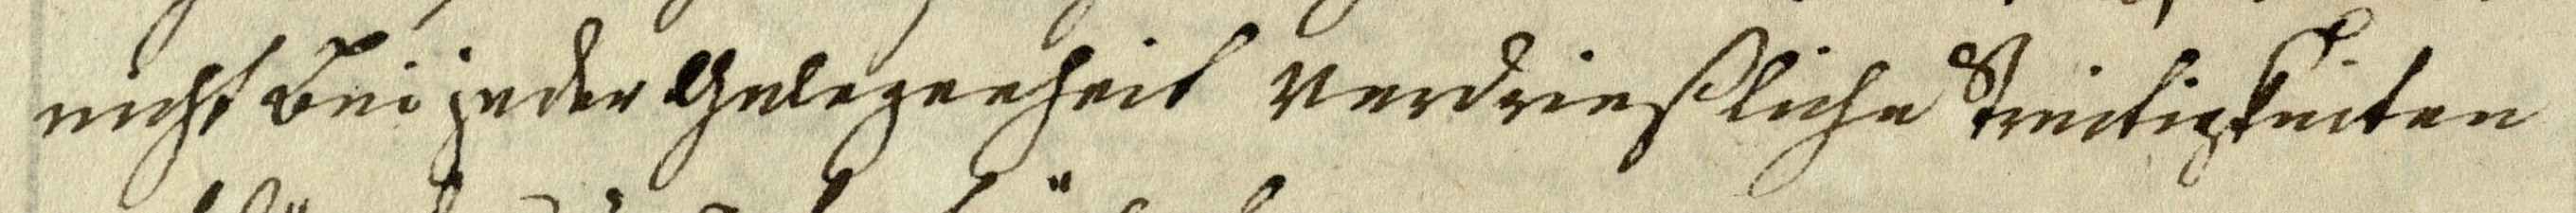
nicht bei jeder Gelegenheit verdrießliche Streitigkeiten
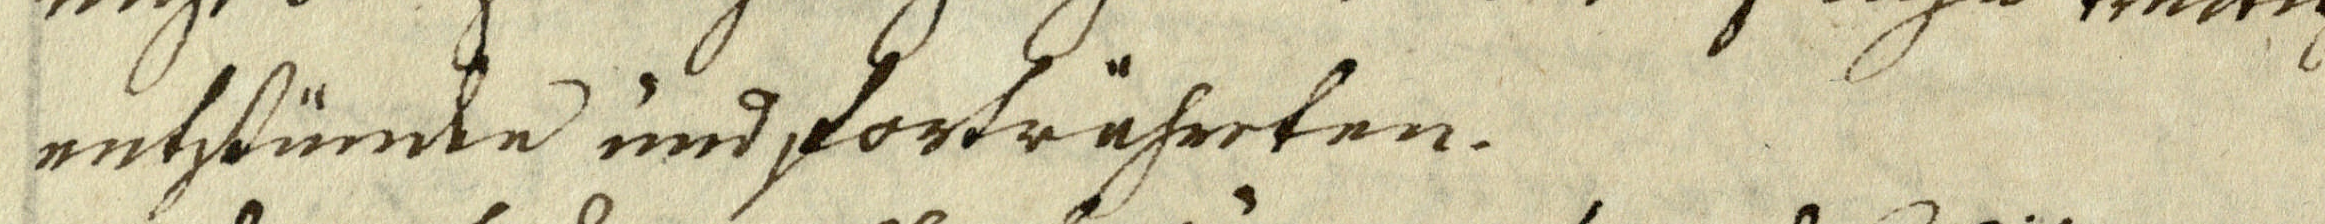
entstünden und fortwähreten.
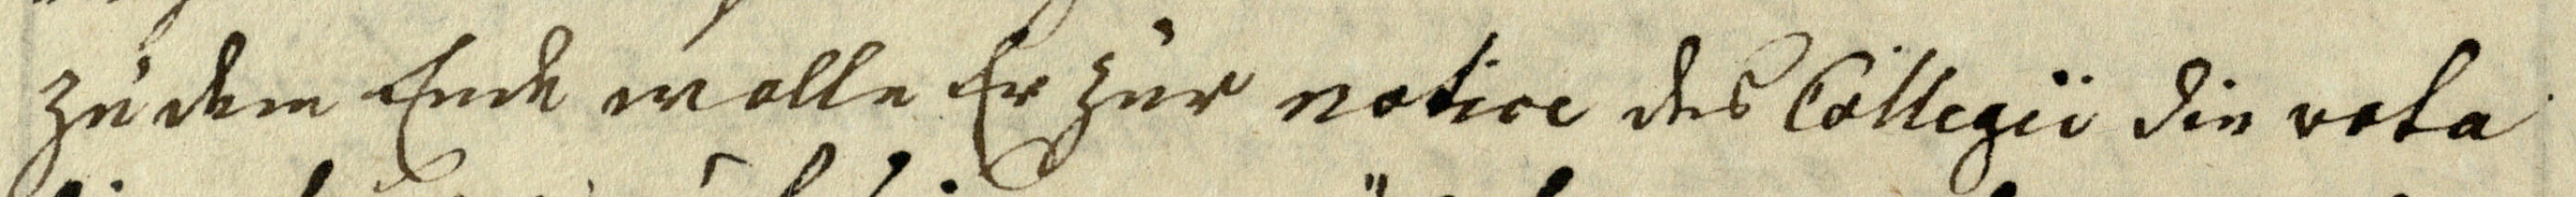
Zu dem Ende wolle Er zur notice des Collegii die vota
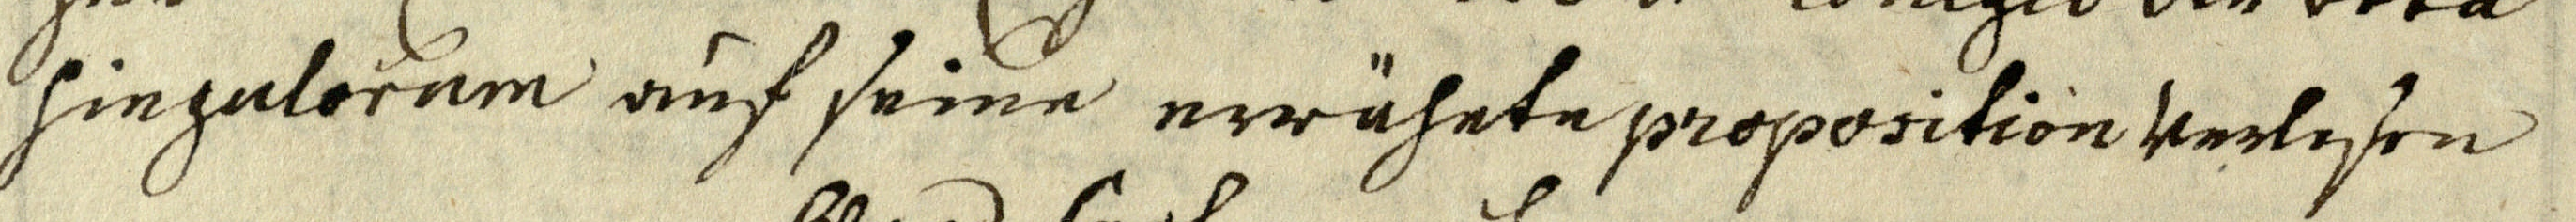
singulorum auf seine erwähnte proposition verlesen.
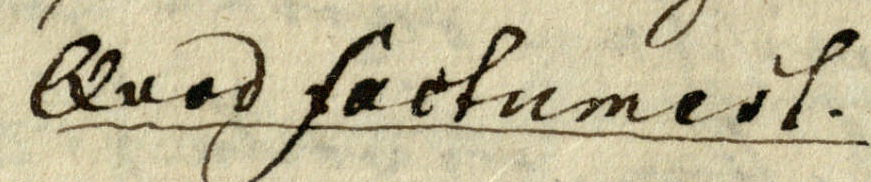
Quod factum est.
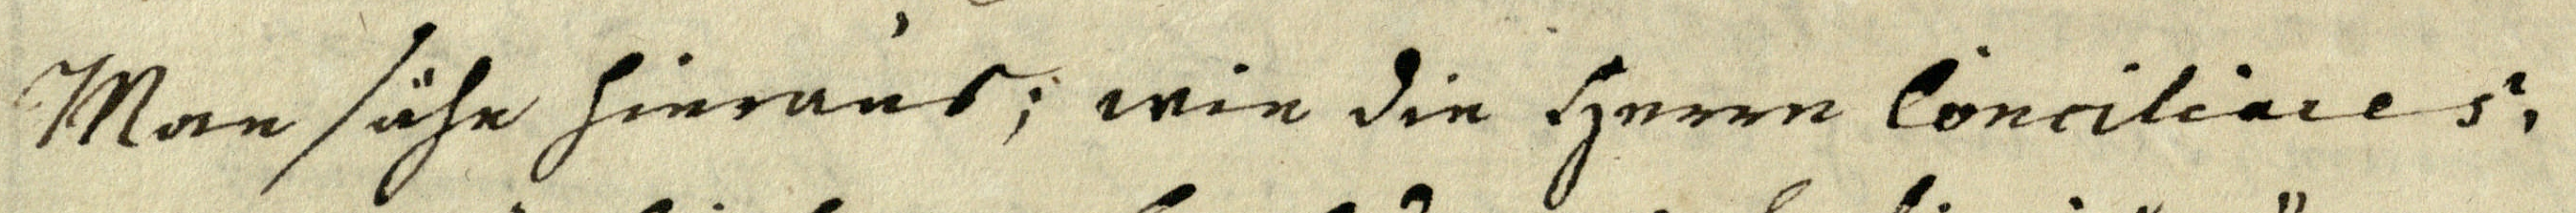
Man sähe hieraus; wie die Herrn Conciliares,
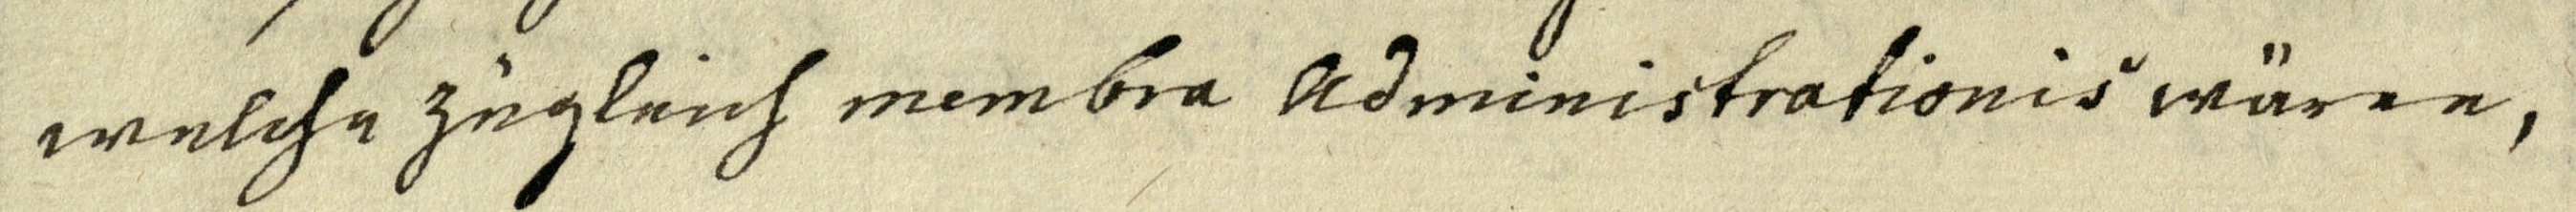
welche zugleich membra Administrationis wären,
